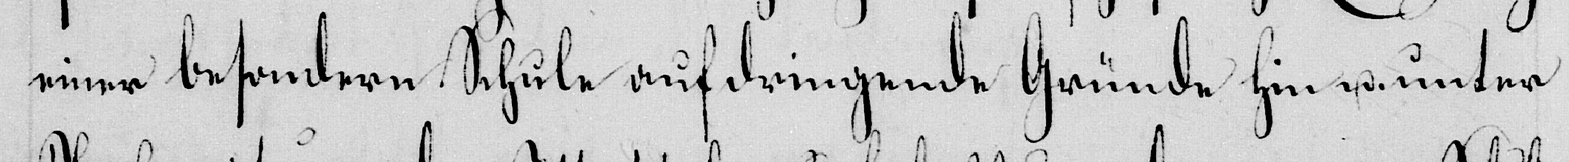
einer besondern Schule auf dringende Gründe hin u. unter
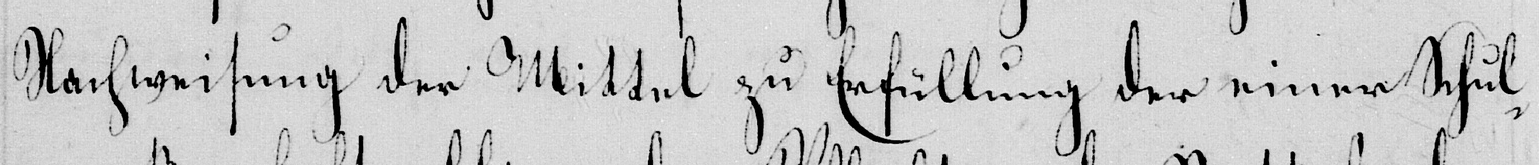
Nachweisung der Mittel zu Erfüllung der einen Schul¬
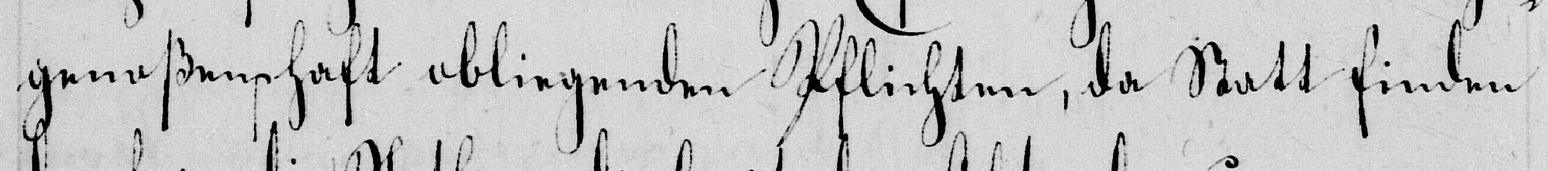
genoßenschaft obliegenden Pflichten, da Statt finden
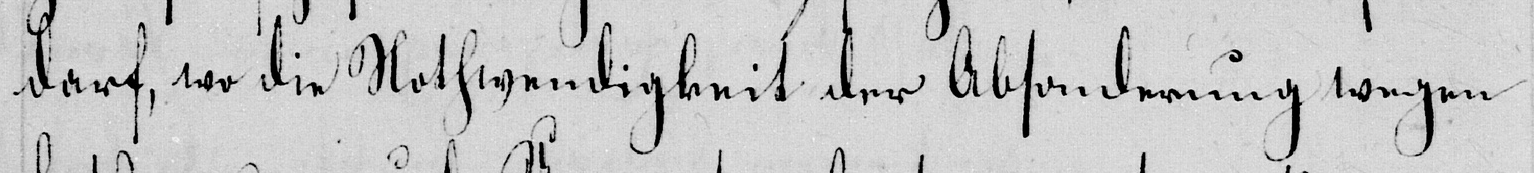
darf, wo die Nothwendigkeit der Absonderung wegen
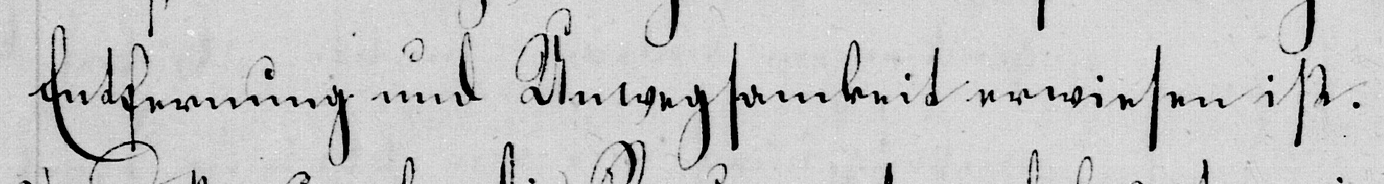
Entfernung und Unwegsamkeit erwiesen ist.
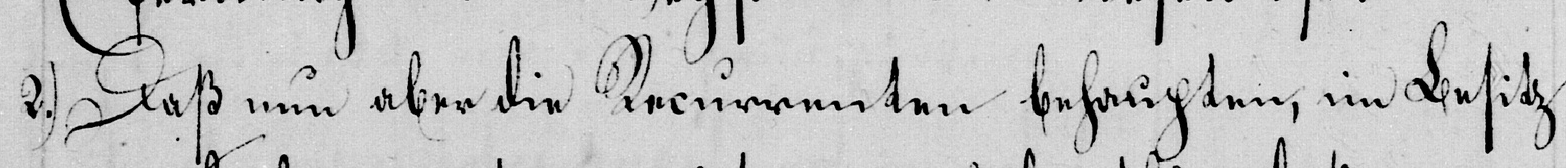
2.) Daß nun aber die Recurrenten behaupten, im Besitz
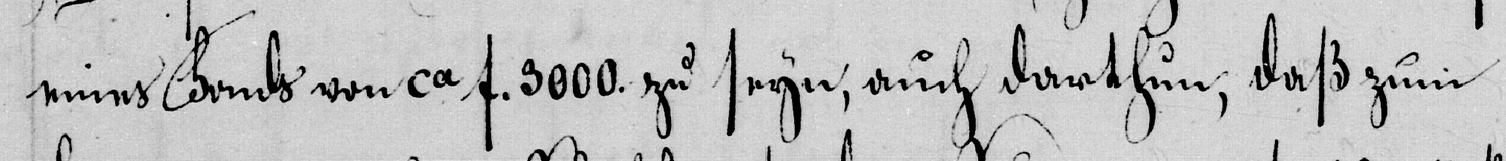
eines Fonds von ca f. 3000. zu seyn, auch darthun, daß zum
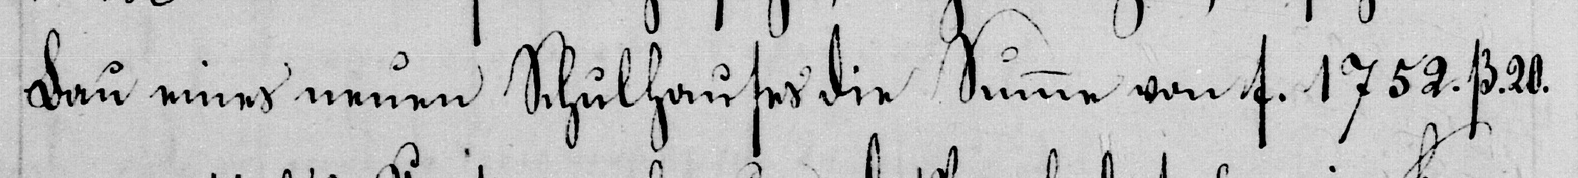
Bau eines neuen Schulhauses die Summe von f. 1752. ß. 20.
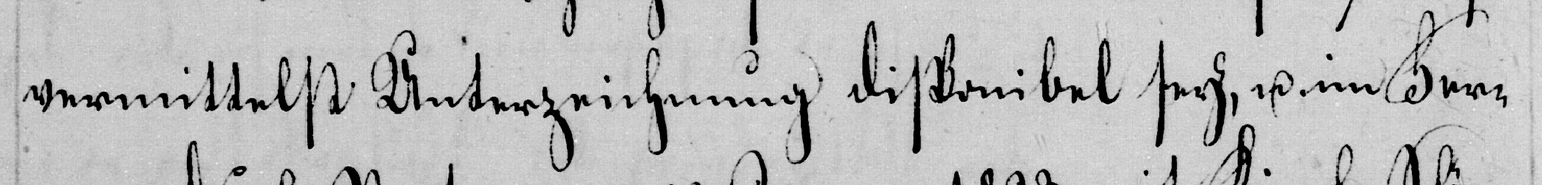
vermittelst Unterzeichnung disponibel sey, u. im Fer¬
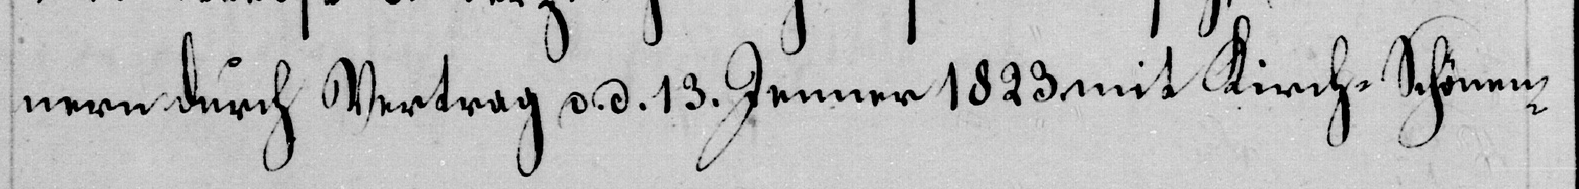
nern durch Vertrag d. d. 13. Jenner 1823. mit Kirch-Schönen-
